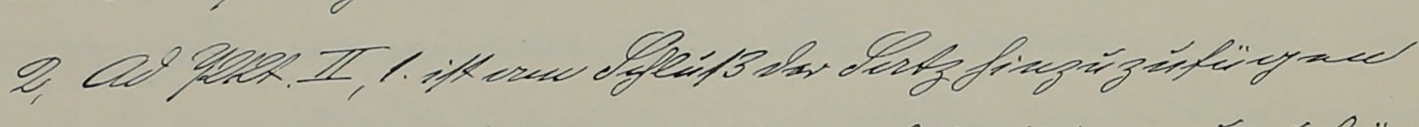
2. Ad Pkt. II,1. ist am Schluß der Satz hinzuzufügen
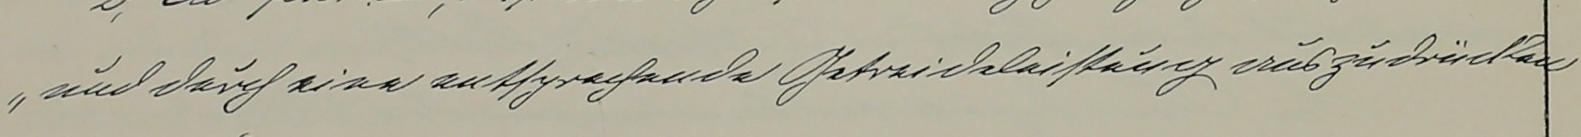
„und durch eine entsprechende Getreideleistung auszudrücken
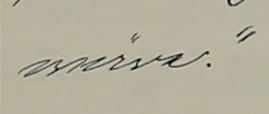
wäre.“
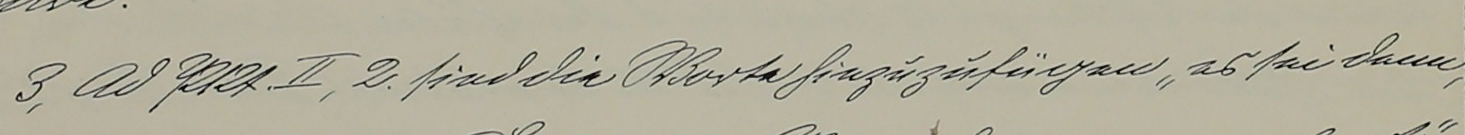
3. Ad Pkt. II,2. sind die Worte hinzuzufügen „es sei denn,
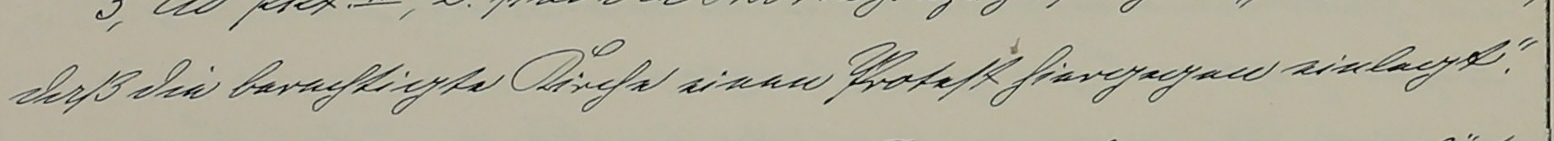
daß die berechtigte Kirche einen Protest hiergegen einlegt.“
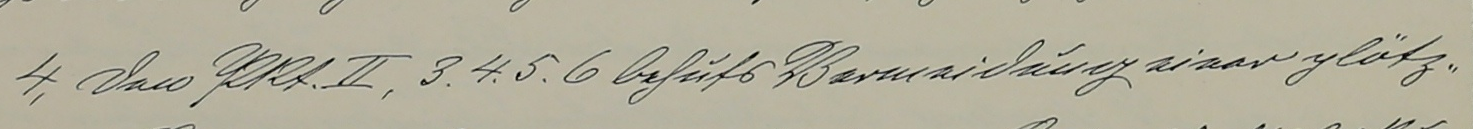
4. Den Pkt. II, 3.4.5.6 behufs Vermeidung einer plötz-
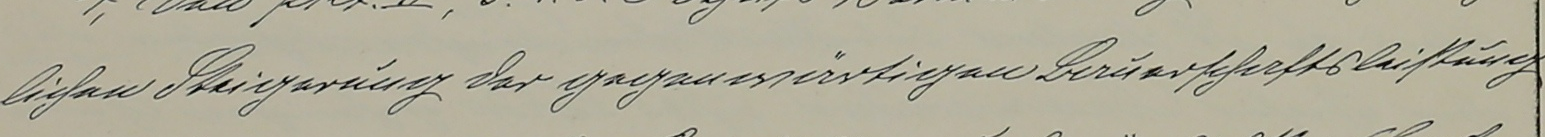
lichen Steigerung der gegenwärtigen Bauerschaftsleistung
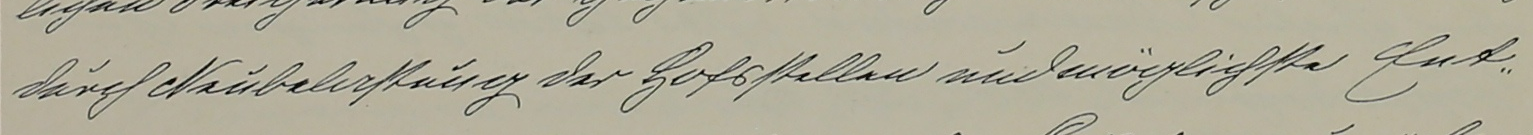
durch Neubelastung der Hofsstellen und möglichste Ent-
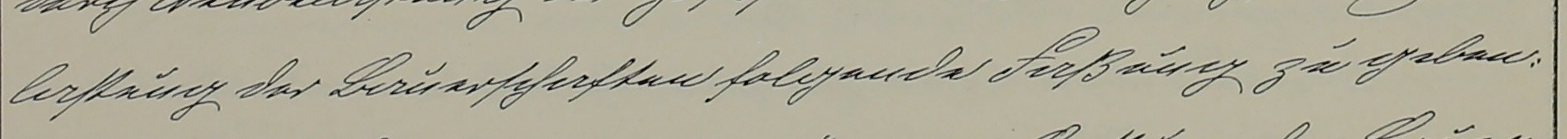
lastung der Bauerschaften folgende Faßung zu geben:
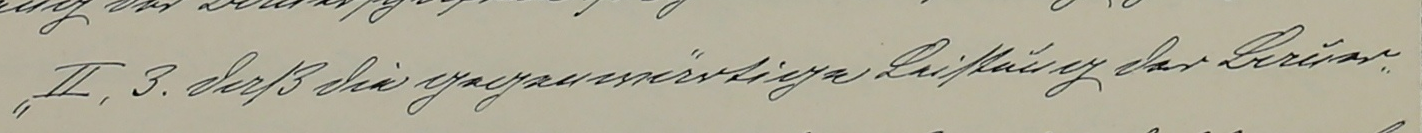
„II,3. daß die gegenwärtige Leistung der Bauer-
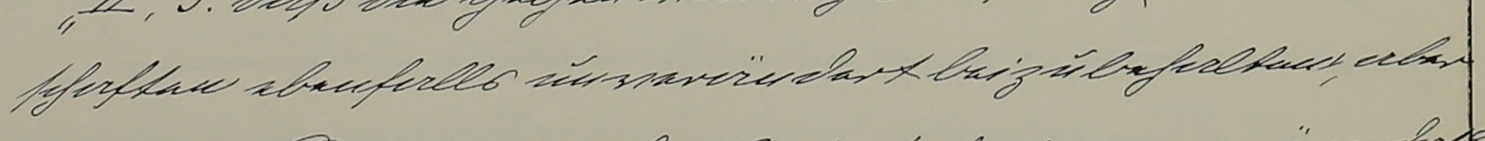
schaften ebenfalls unverändert beizubehalten, aber
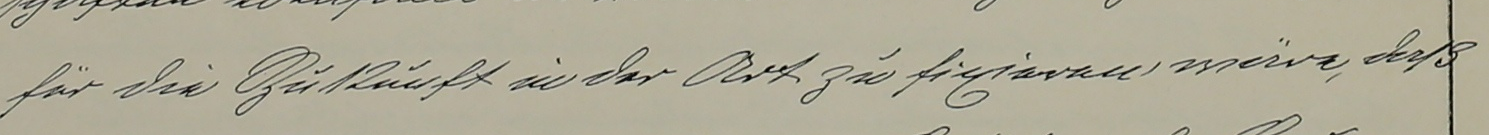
für die Zukunft in der Art zu fixieren wäre, daß
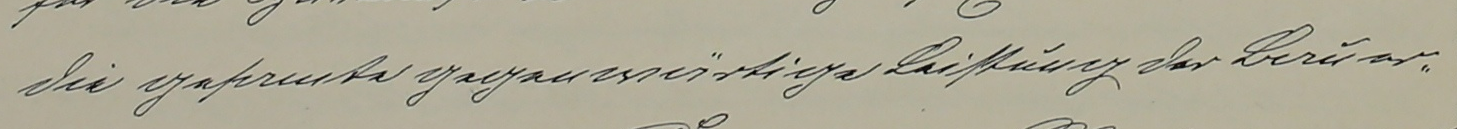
die gesamte gegenwärtige Leistung der Bauer-
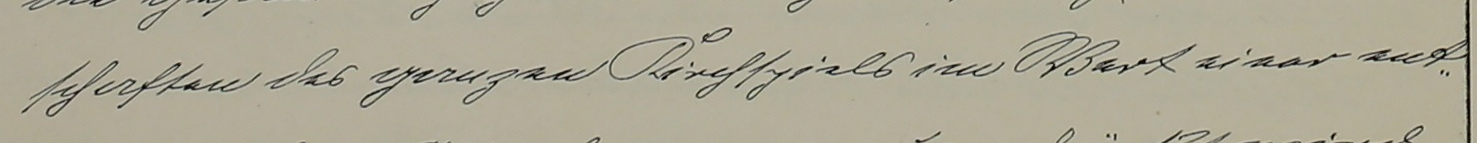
schaften des ganzen Kirchspiels im Wert einer ent-
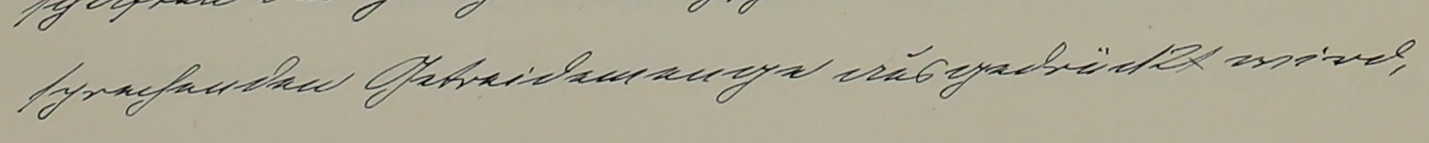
sprechenden Getreidemenge ausgedrückt wird,
